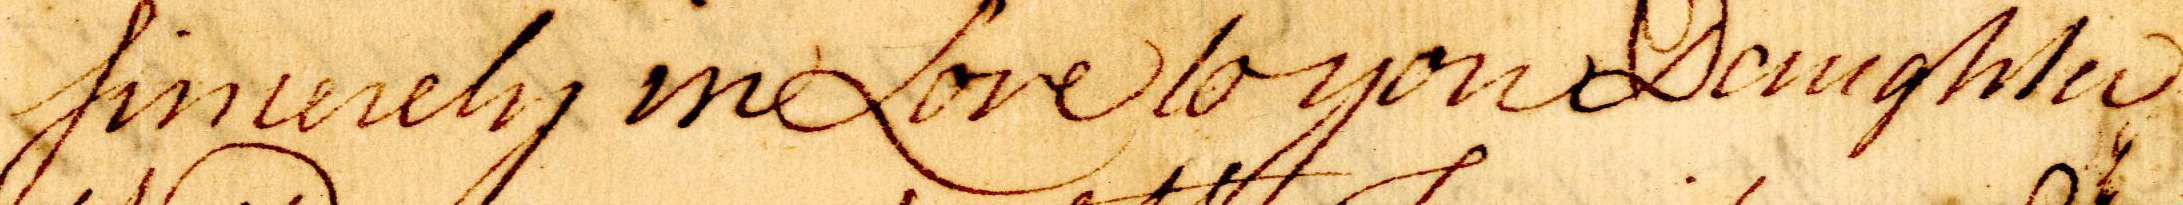Sincerely in Love to you Daughter
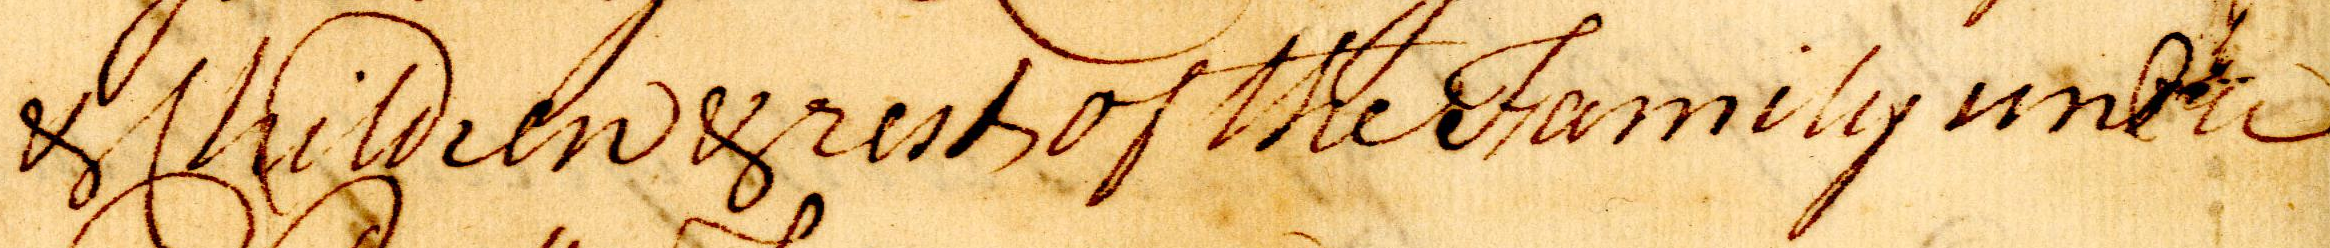& Children & rest of the Family until
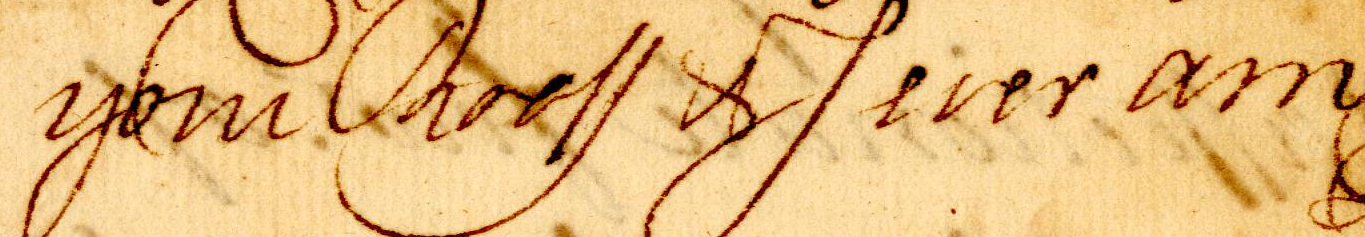your Roall & I ever am
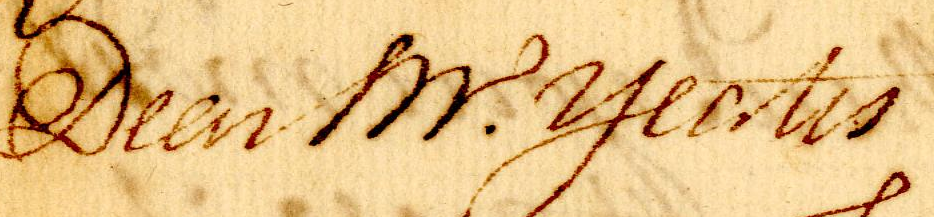Dear M^r. Yeates
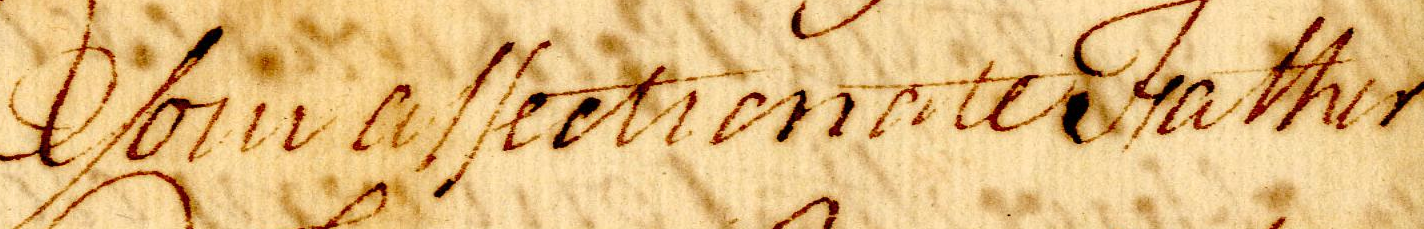Your affectionate Father
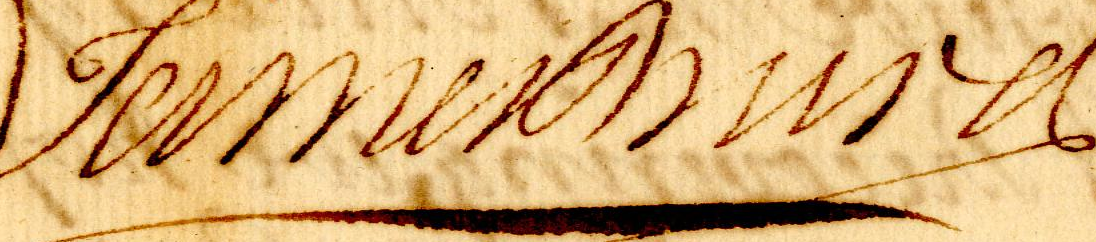James Burd
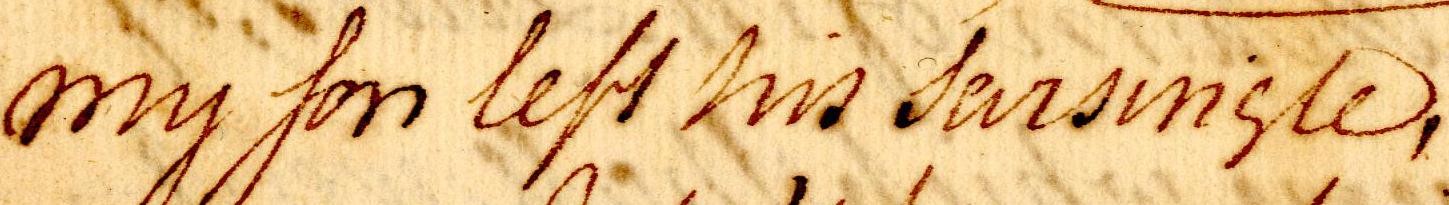my son left his Sarsingle,
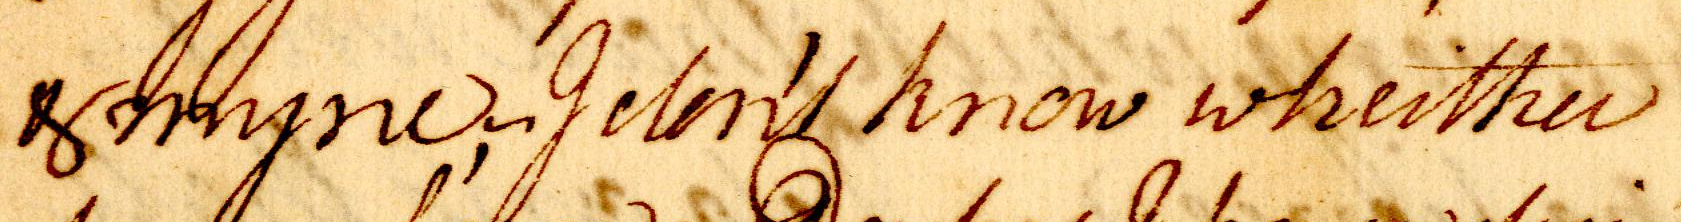& myne, I don't know wheither
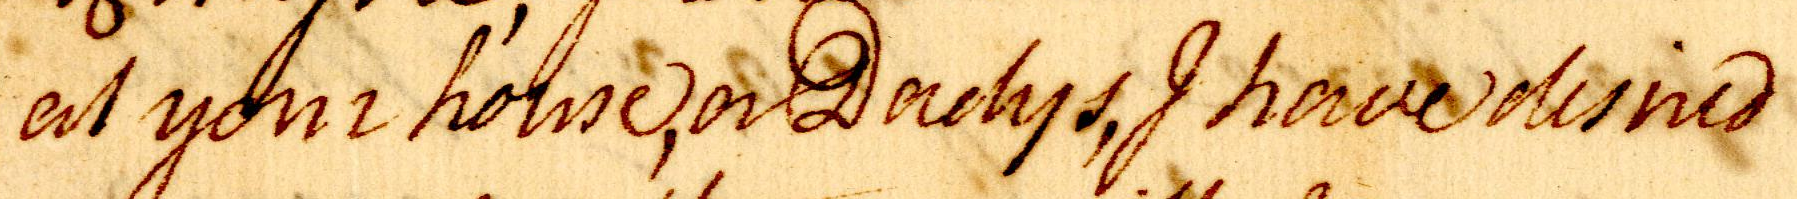at your house, or Dadys, I have desired
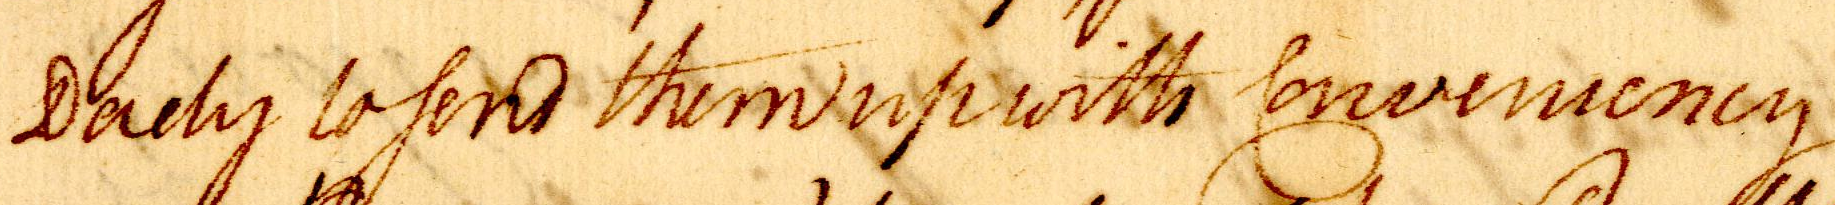Dady to send them up with Conveniency
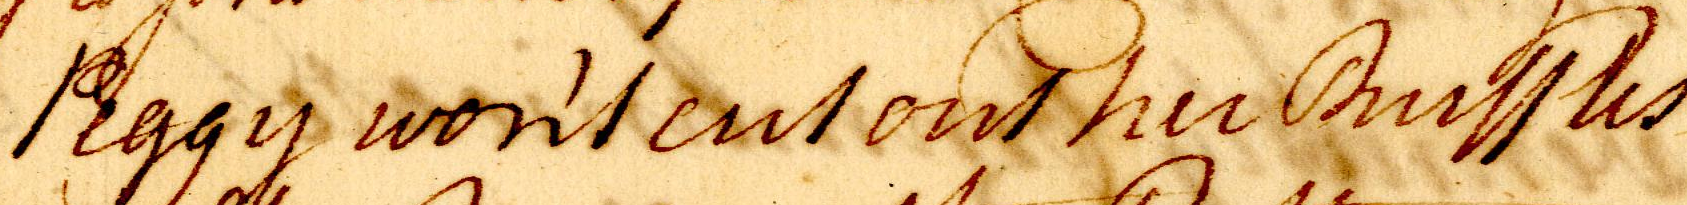Peggy won't cut out her Ruffles
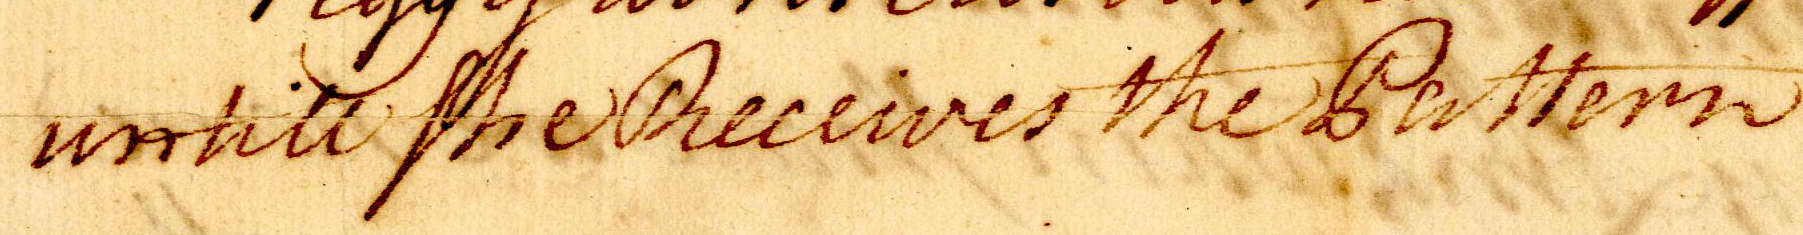untill she Receives the Pattern
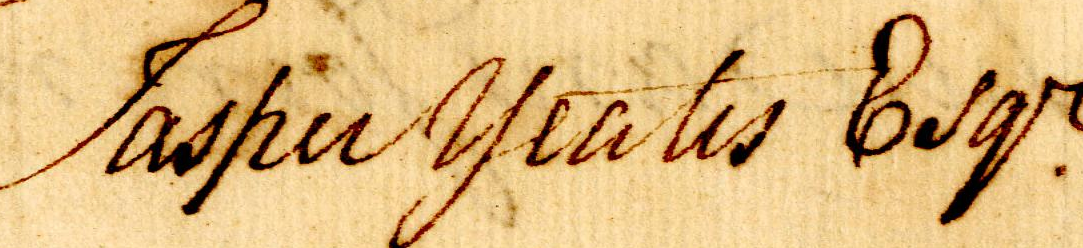Jasper Yeates Esq^r
